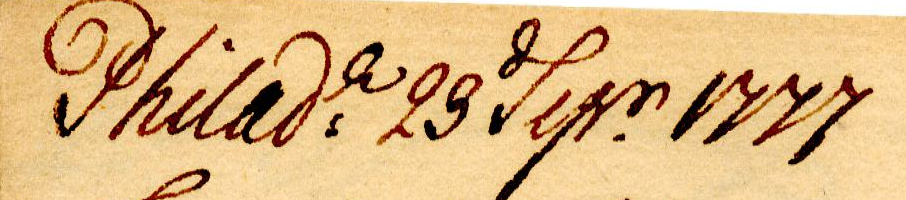Philad^a. 23^d Sep^r. 1777
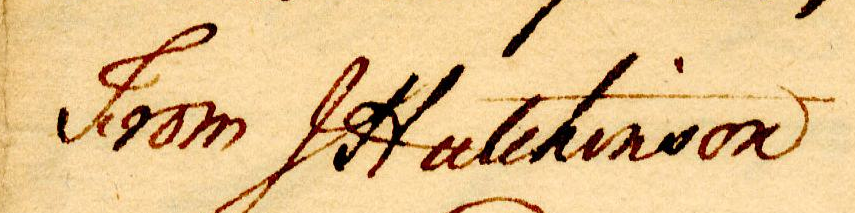From J Hutchinson
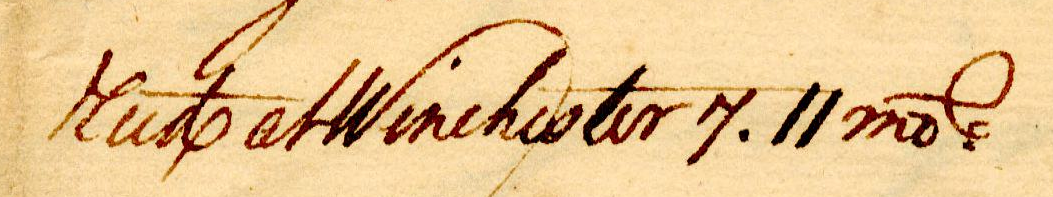recd at Winchester 7. 11 mo.
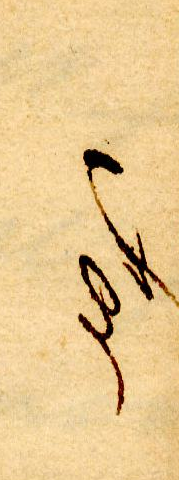For
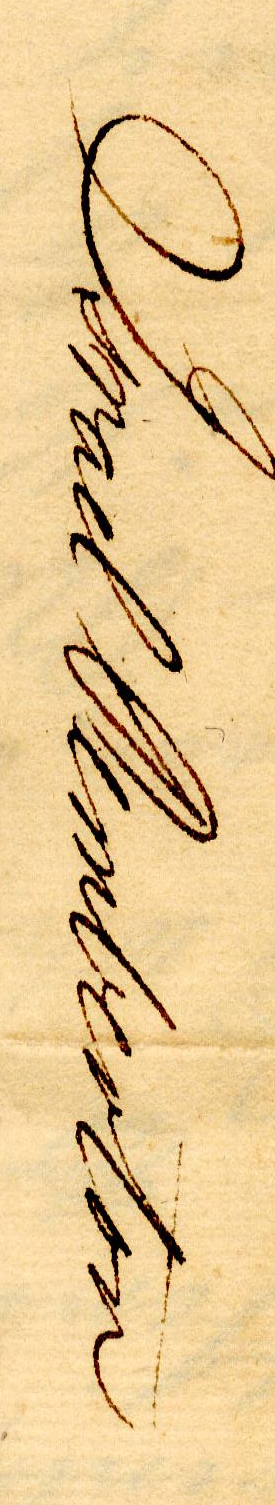Israel Pemberton
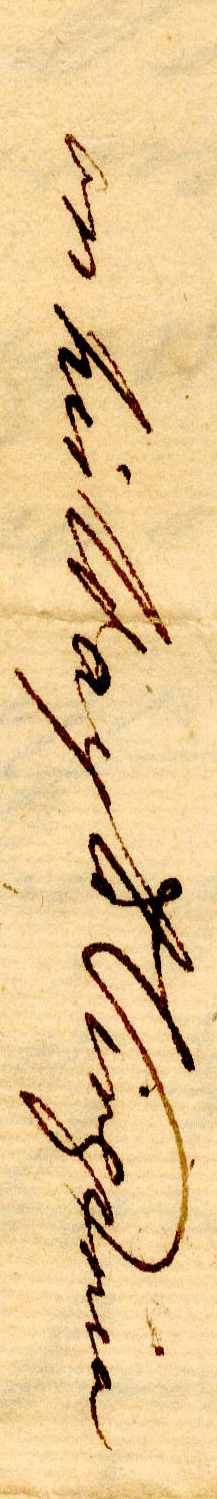on his Way to Virginia
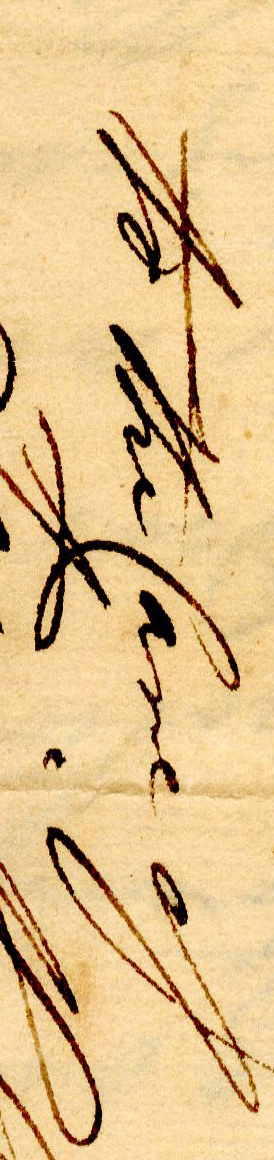to the Care of
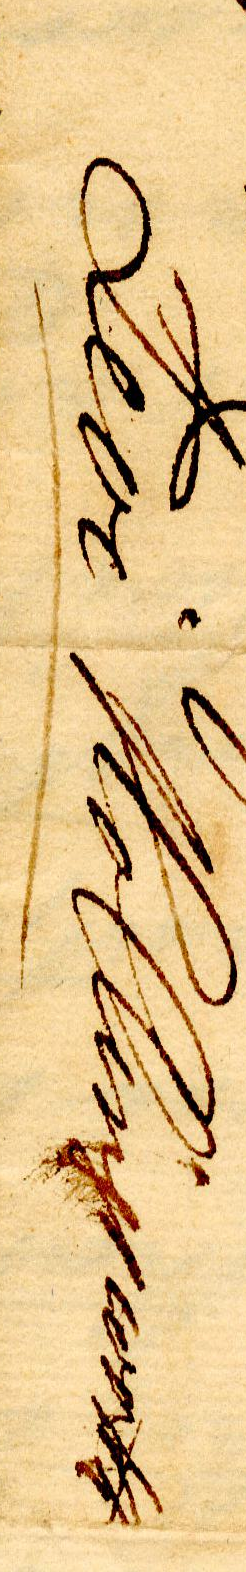Levi Hollingsworth
